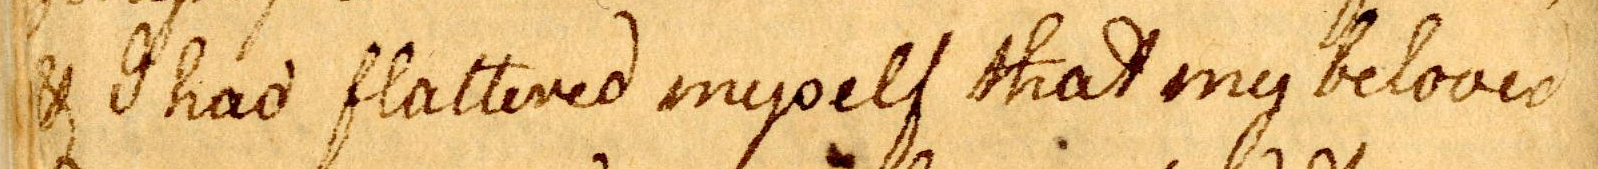& I had flattered myself that my beloved
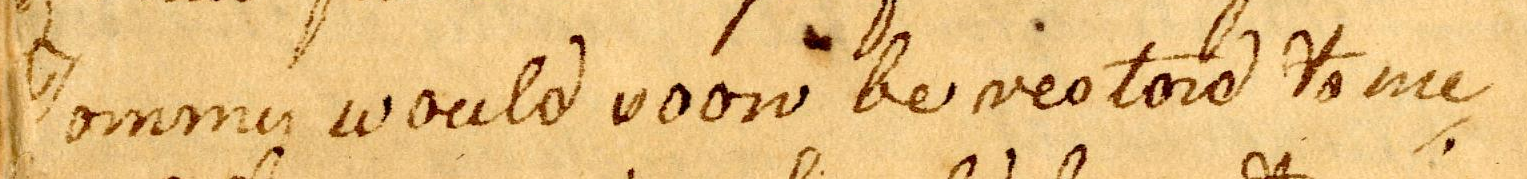Tommy would soon be restord to me
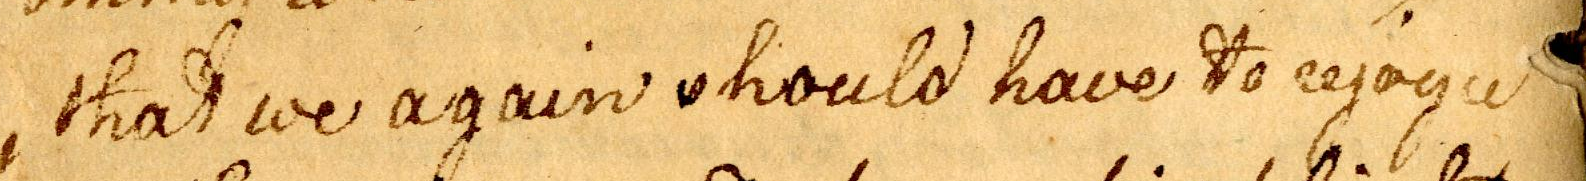that we again should have to rejoyce
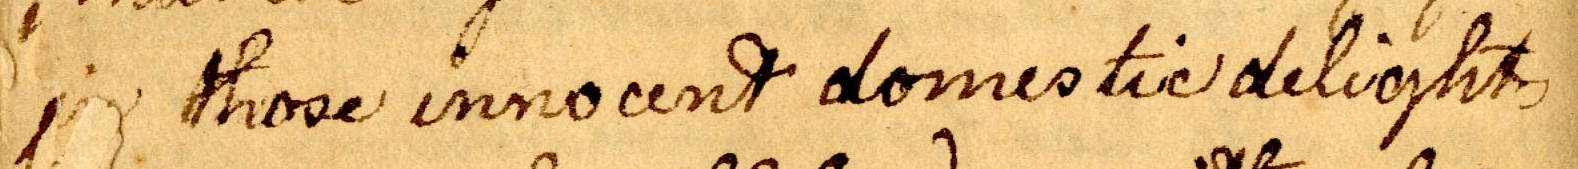in those innocent domestic delights
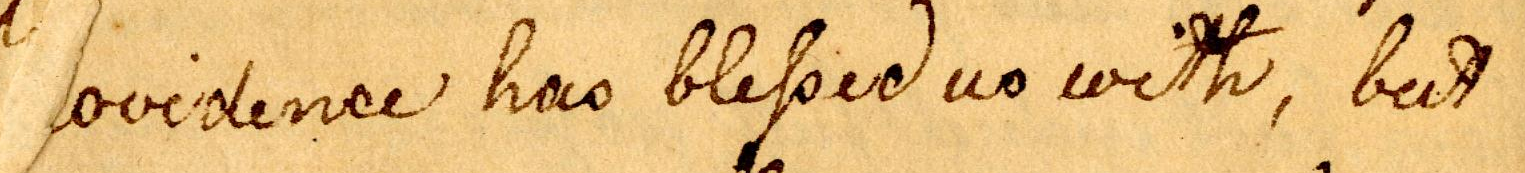ovidence has blessed us with, but
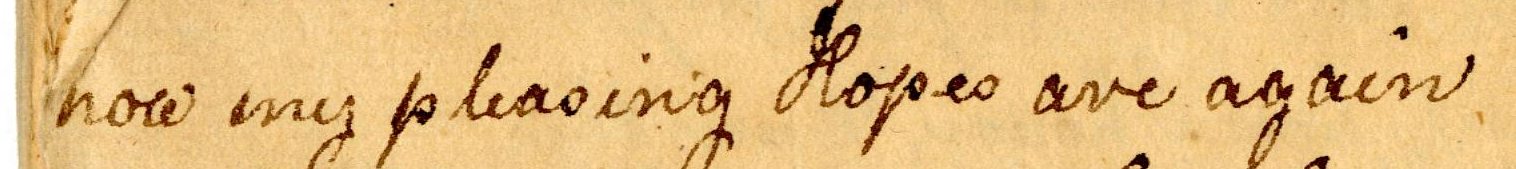now my pleasing Hopes are again
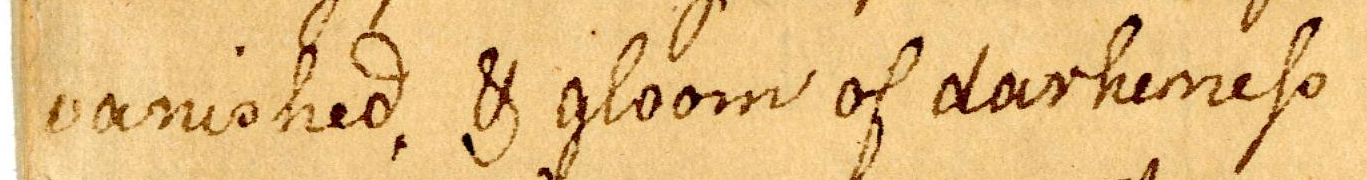vanished & gloom of darkness
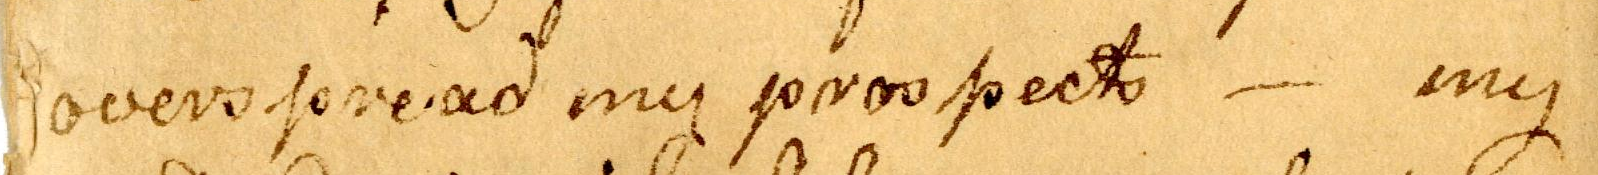overspread my prospects- my
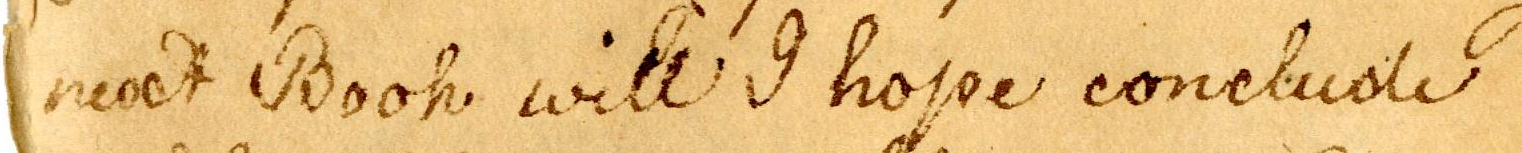next Book will I hope conclude
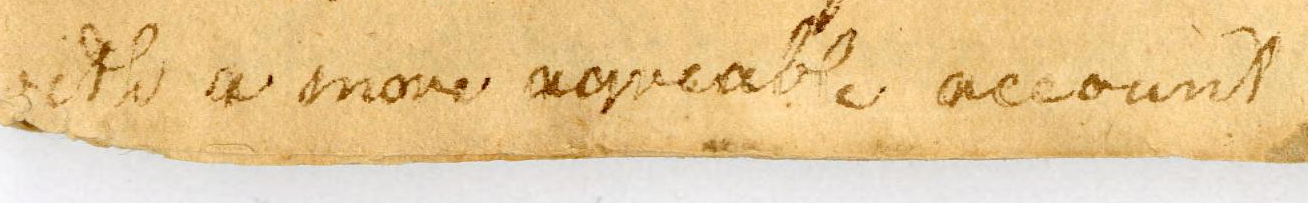with a more agreable account
